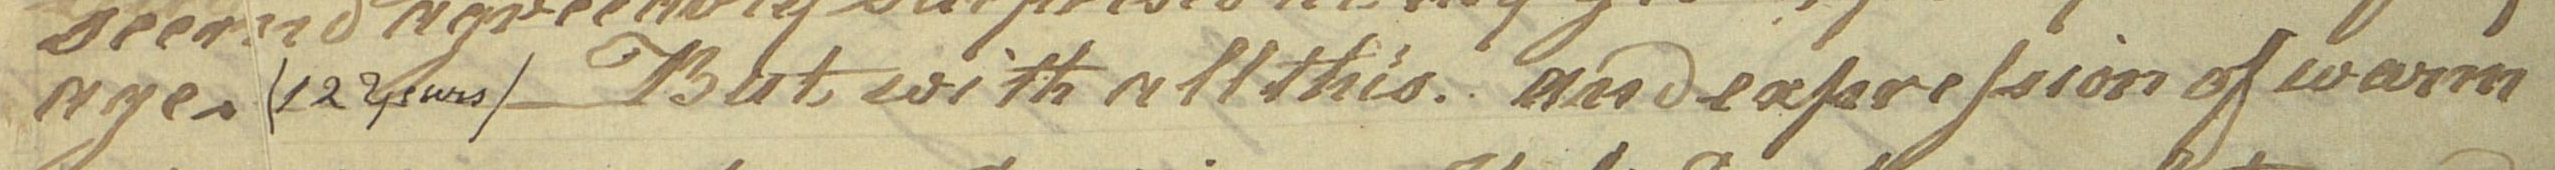age. (12 years) But with all this and expression of warm
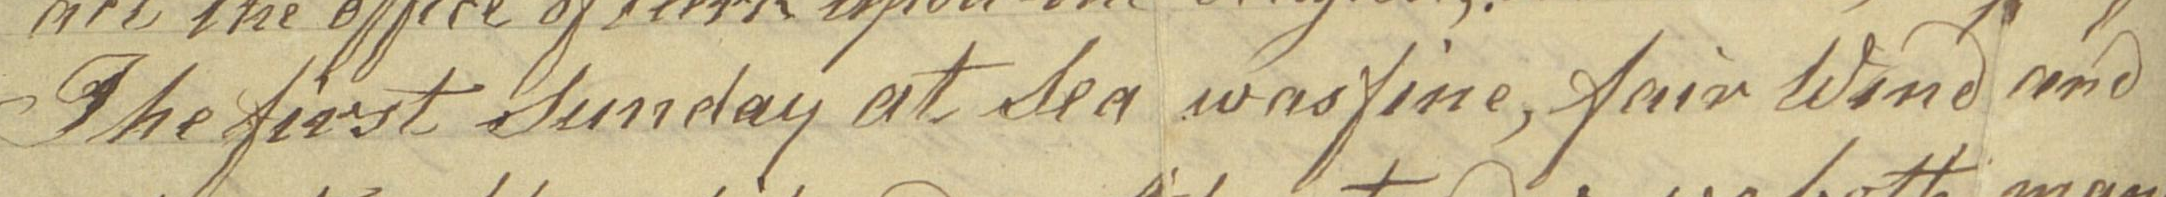The first Sunday at Sea was fine, fair Wind and
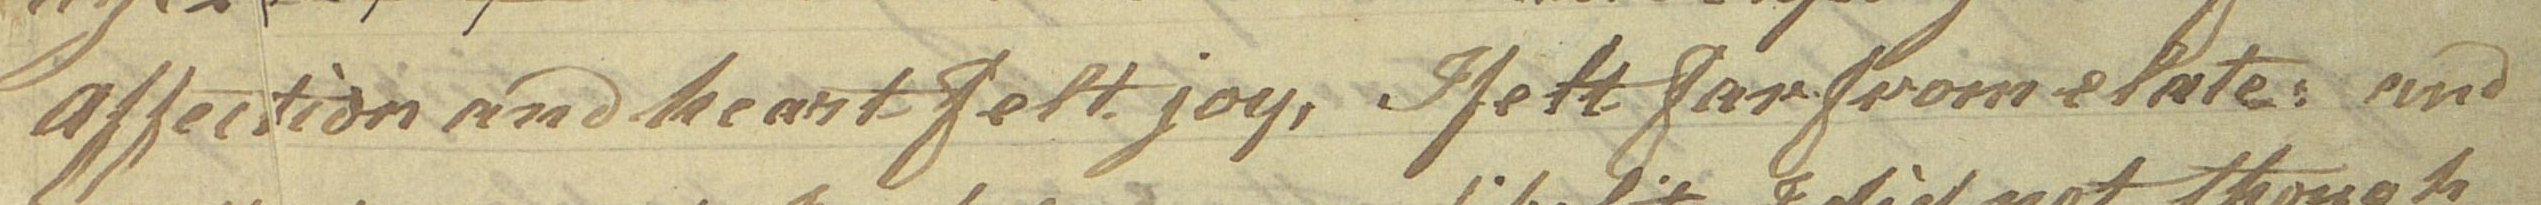Affection and heart felt joy, I felt far from elate: and
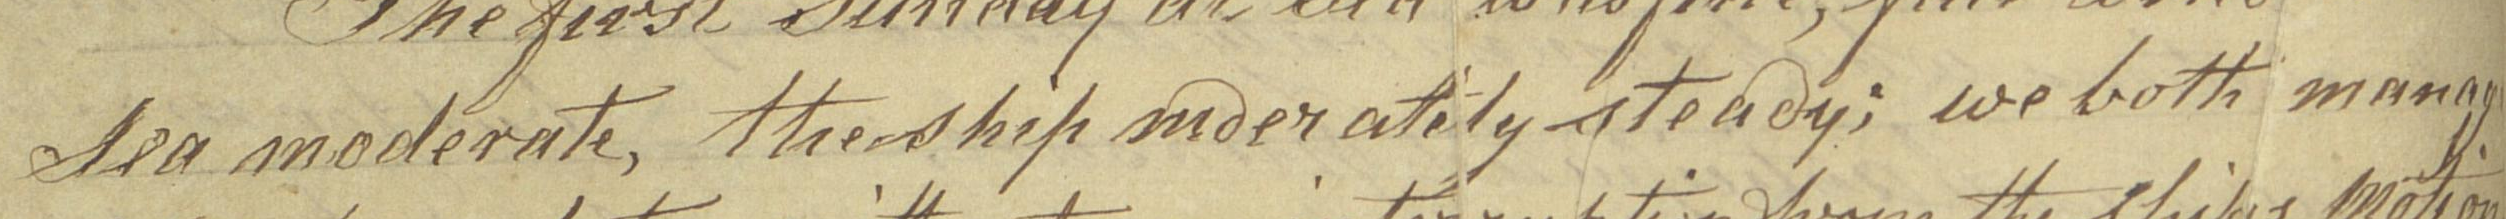Sea moderate, the ship mderately steady; we both manag-
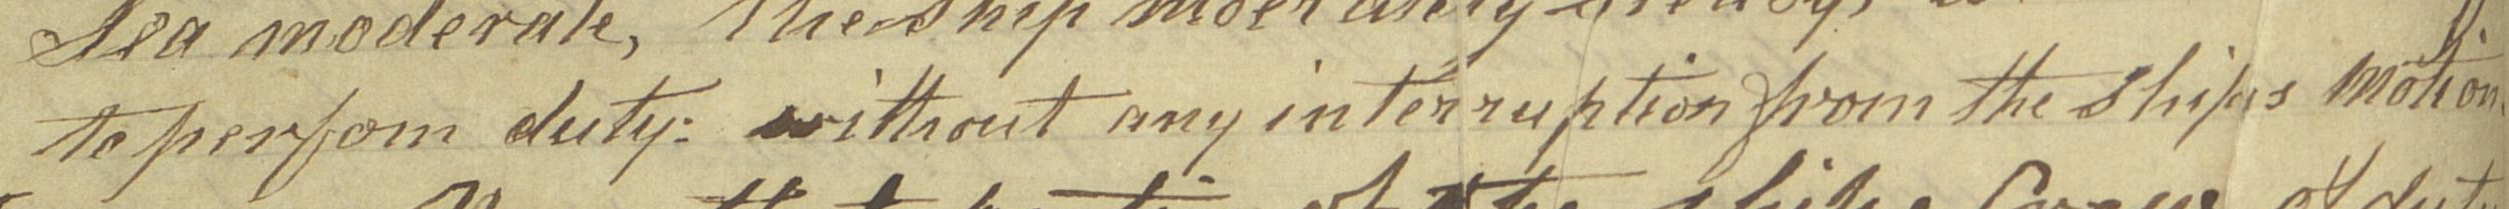to perform duty: without any interruption from the ships Motion
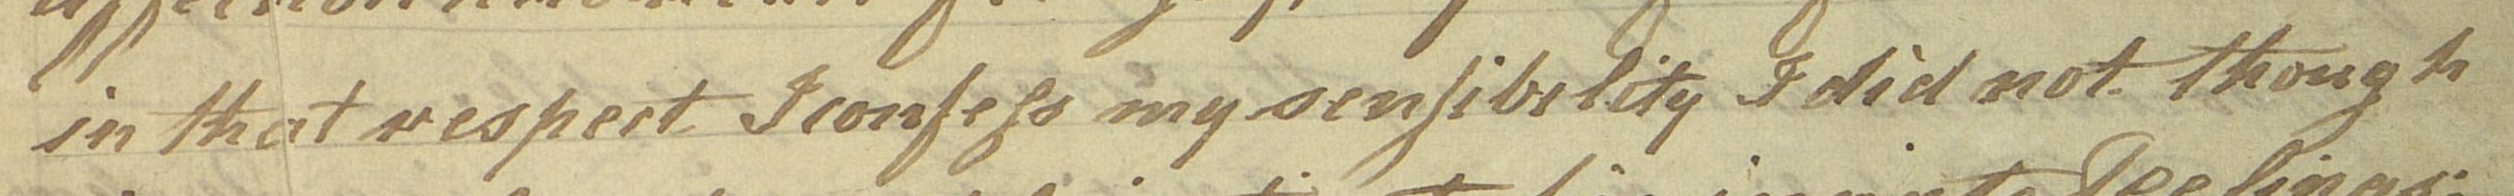in that respect I confess my sensibility I did not though
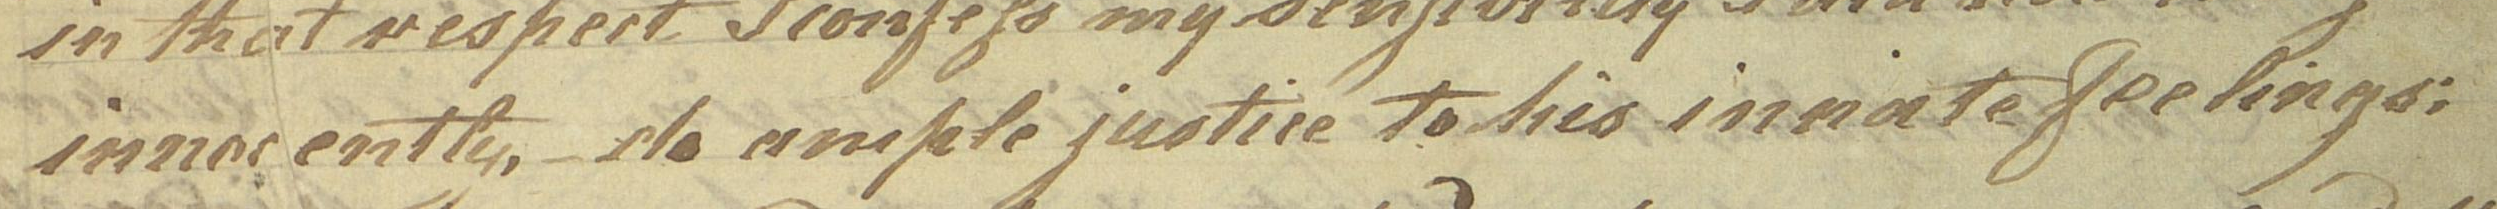innocently do ample justice to his innate feelings:
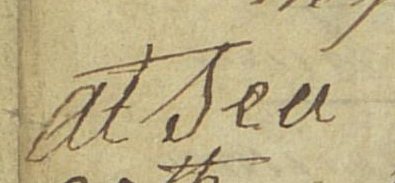at Sea
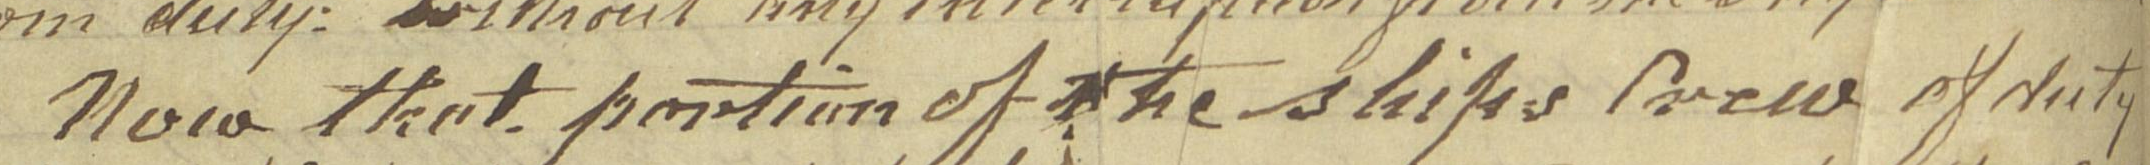Now that portion of the ships Crew of duty
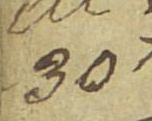30^th
